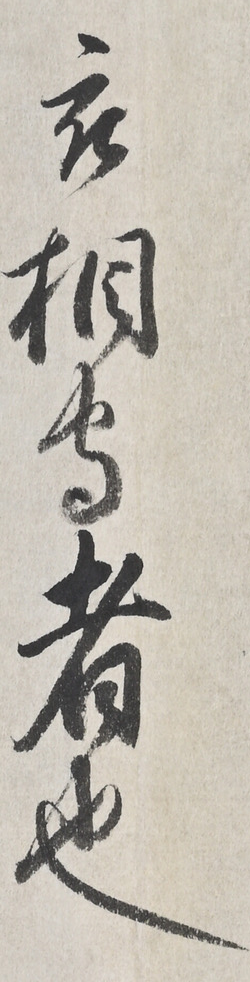被相守者也
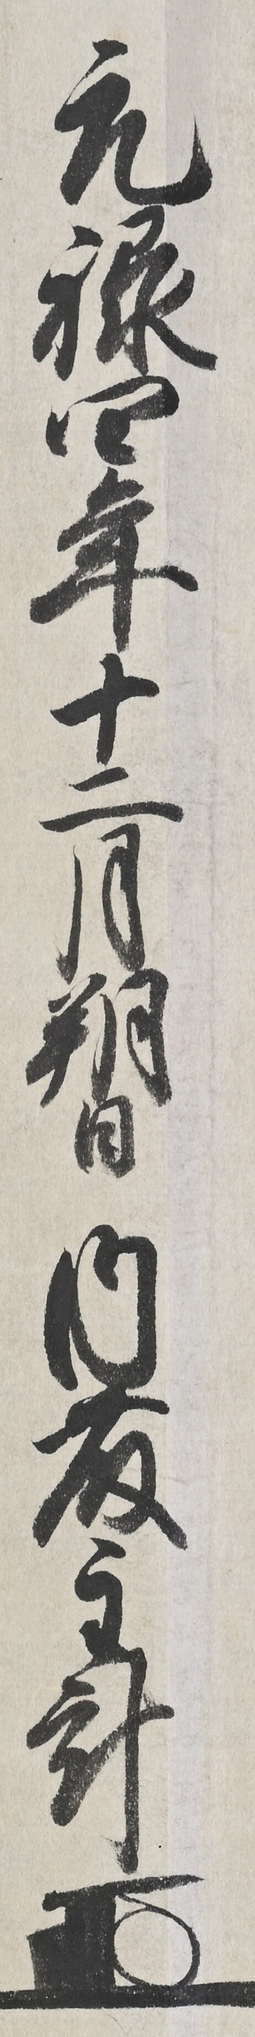元禄四年十二月朔日内藤主計
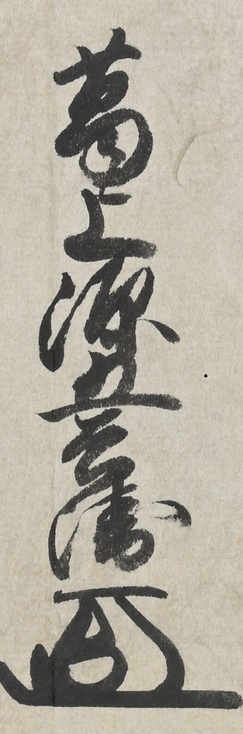葛上源五兵衛
